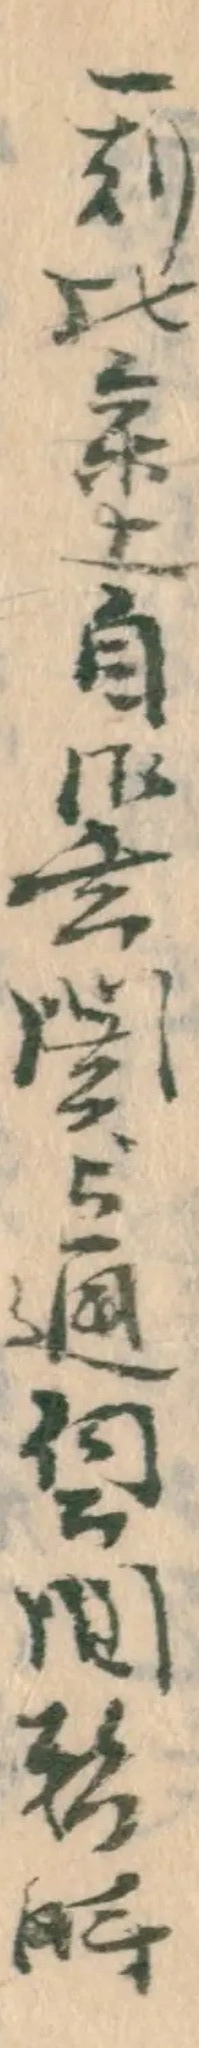一刻頃参上自御玄関被通伺公間暫時
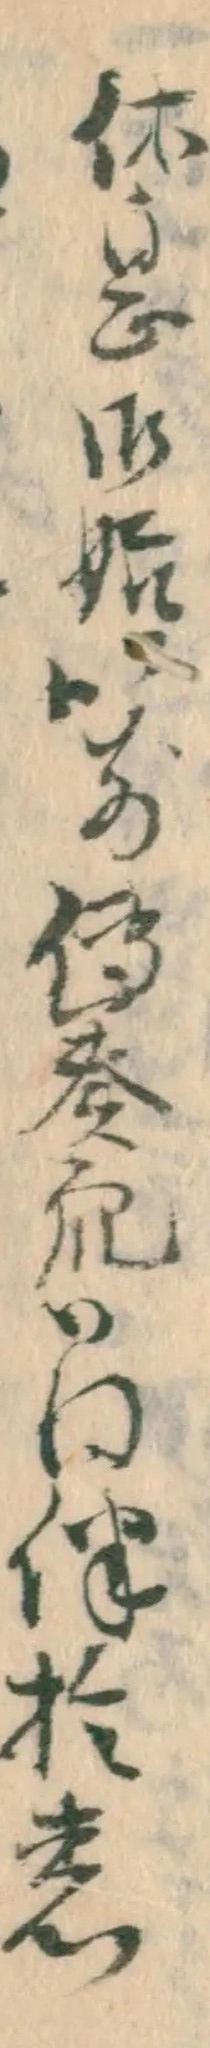休息御始以前伝奏衆御同伴於表
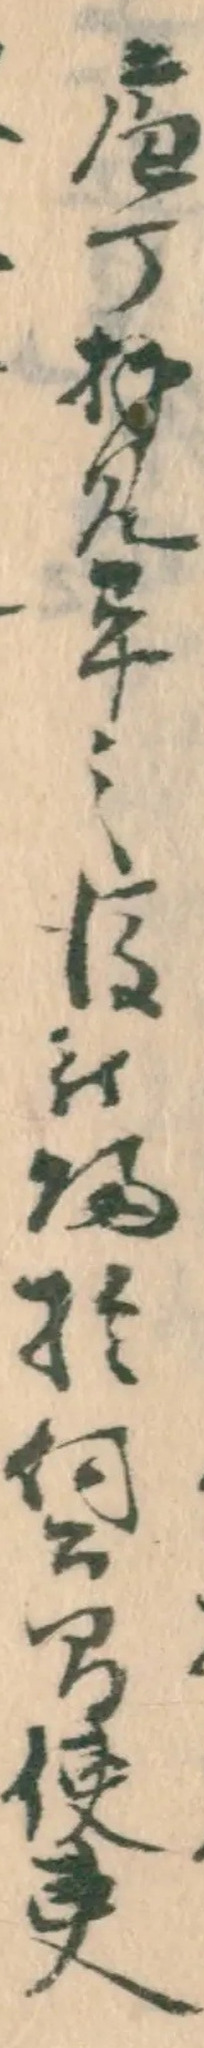包丁拝見畢之後被帰於伺公間使更
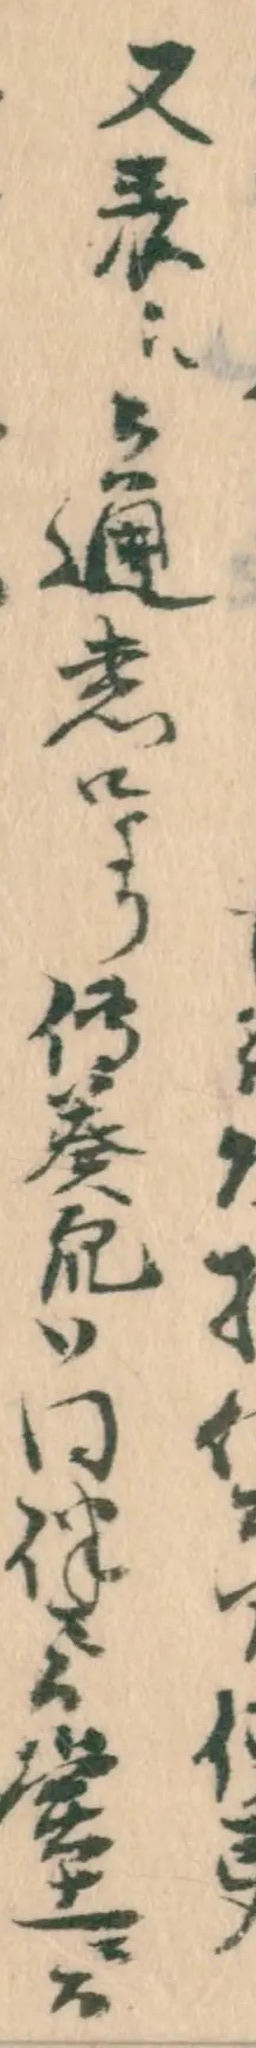又表え被通表口より伝奏衆御同伴ニ而堂上ニ而
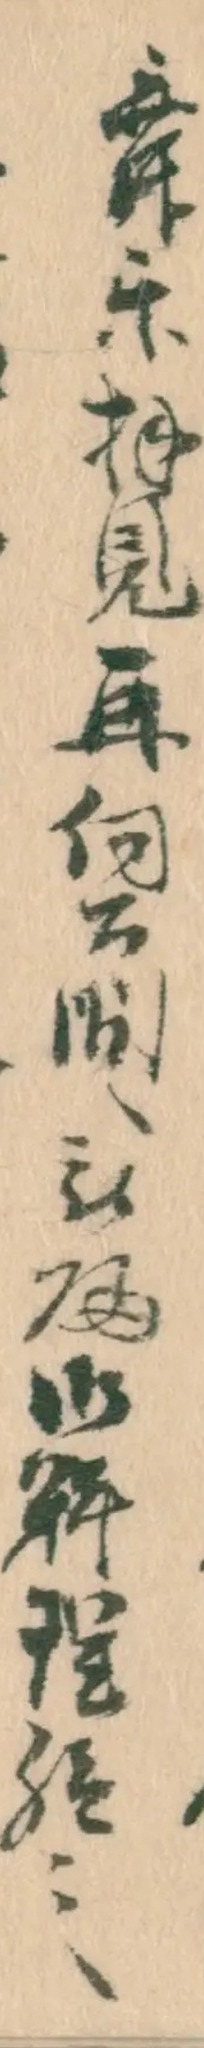舞楽拝見再伺公間へ被帰御料理給之
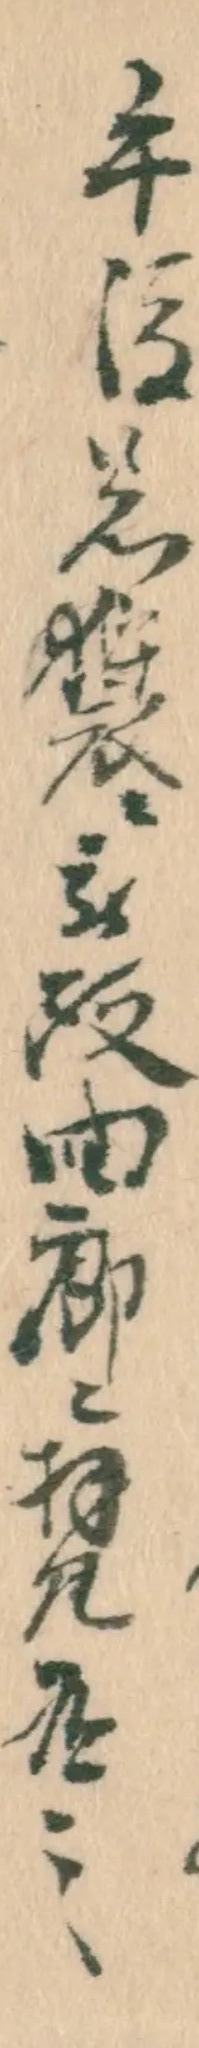午後着狩衣ニ被改回廊ニ拝見有之
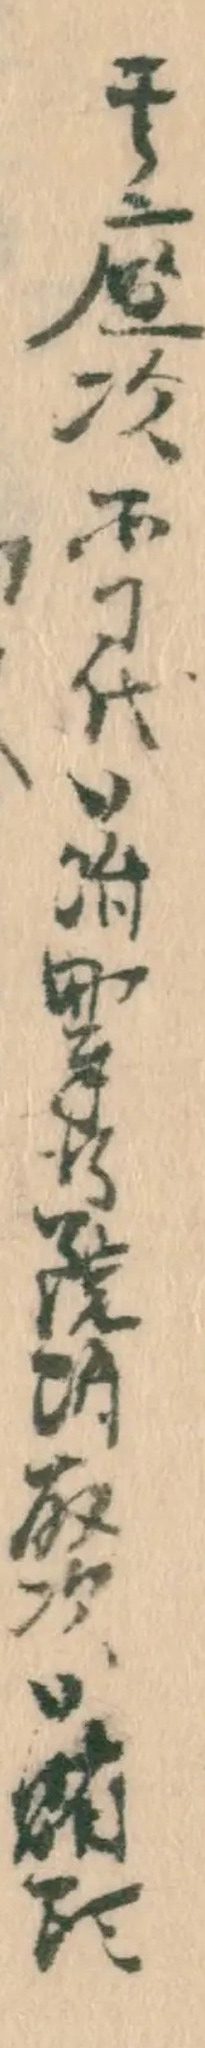其座次所司代御附町奉行院附取次御賄頭
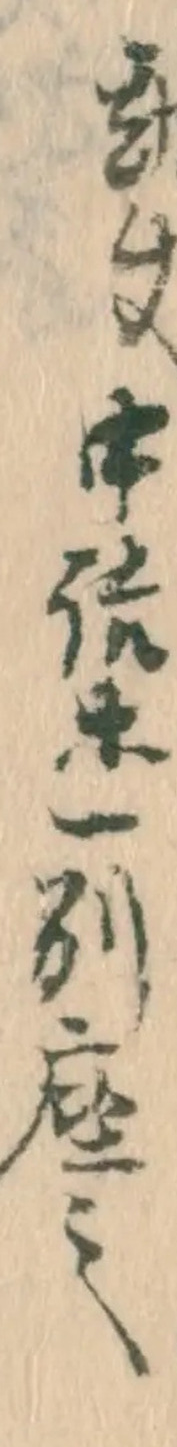勘使中詰等一列座之
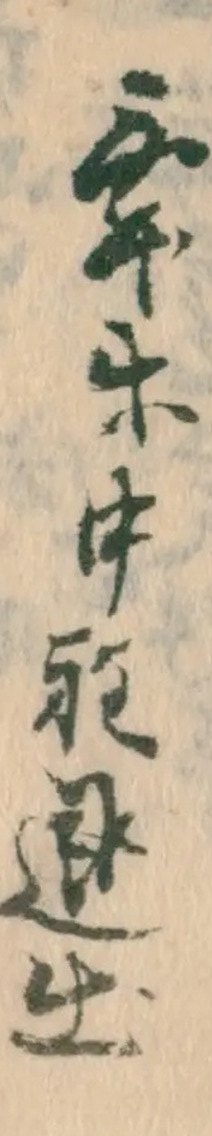舞楽中程退出
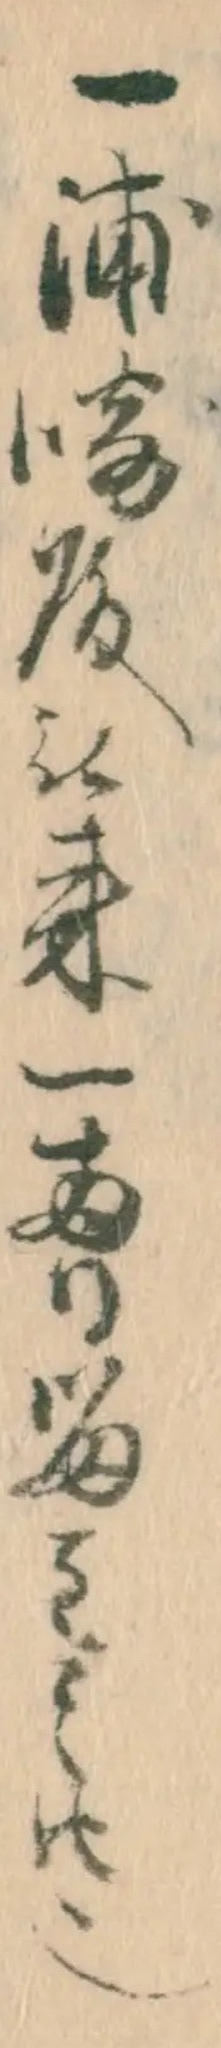一浦崎殿被来一両日留主之由也
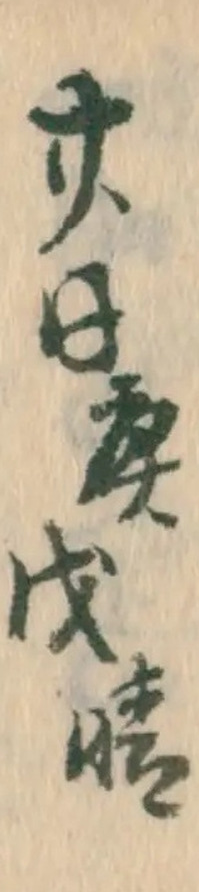廿日庚戌晴
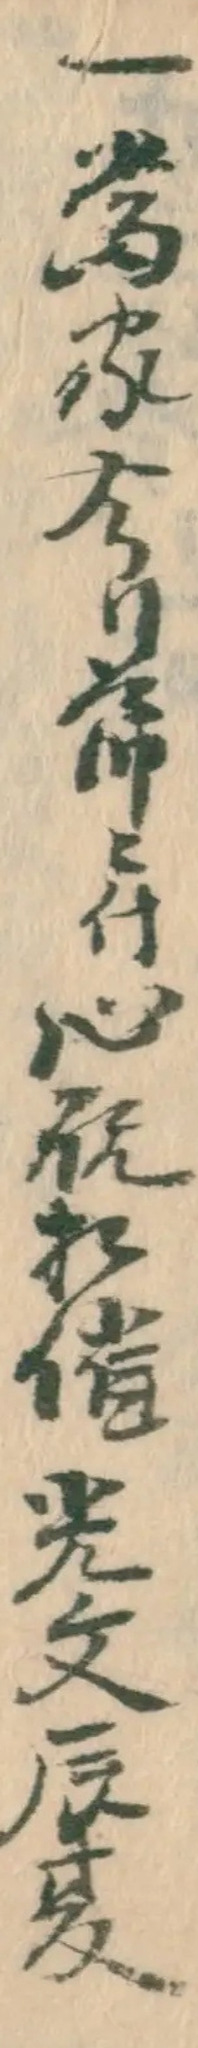一当家今日節ニ付心祝相催光文辰夏
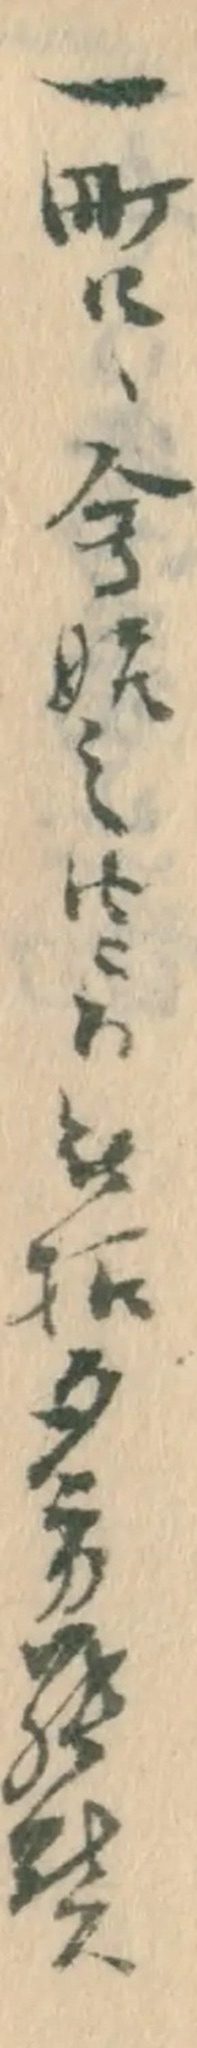一町口へ会始之由ニ付被招夕方罷越ス

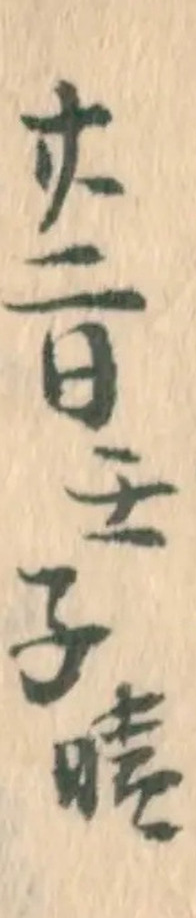廿二日壬子晴
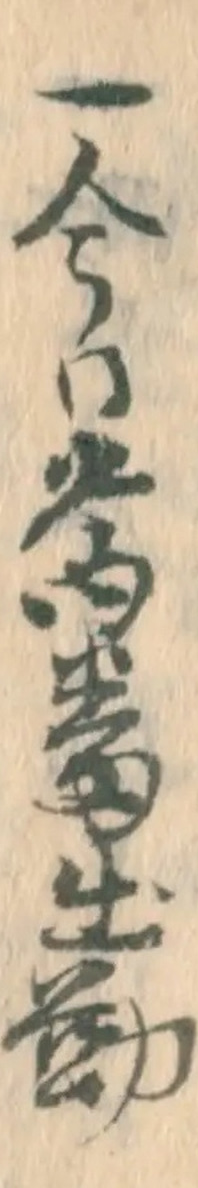一今日当番出勤
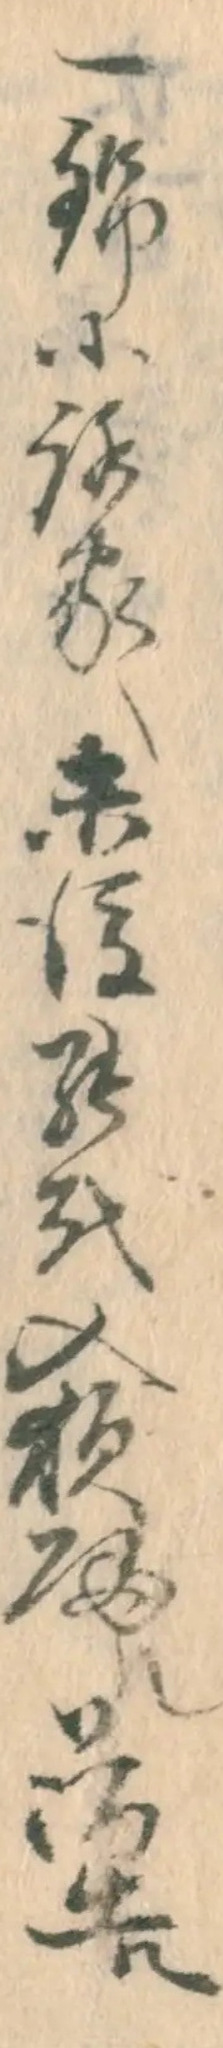一錦小路家へ未後罷越入夜帰ル御酒出ル
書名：禁裏御所御用日記. [131]
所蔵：国立国会図書館 National Diet Library, JAPAN
